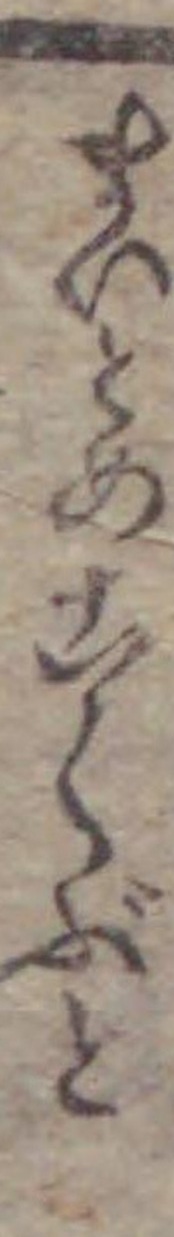まいとめこくぶと
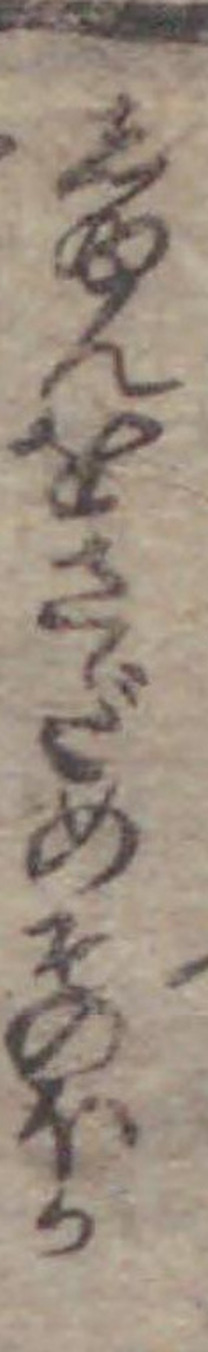しゆんをさだめそのほか
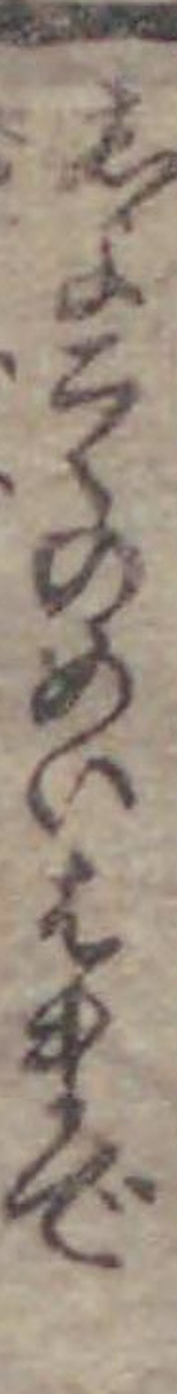しよこくのめいはまで
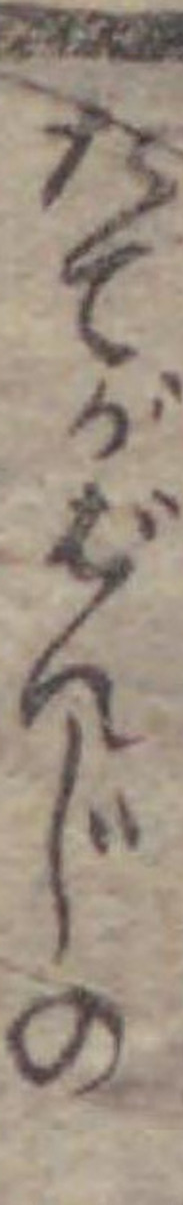たてがばんじの
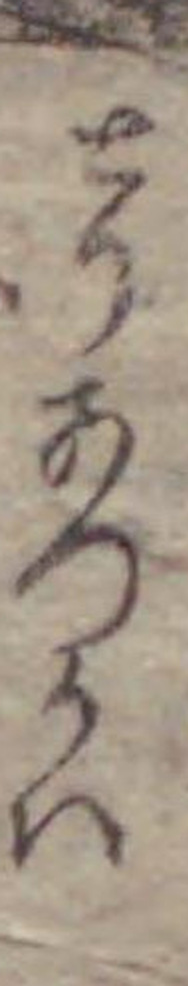とりあつかは
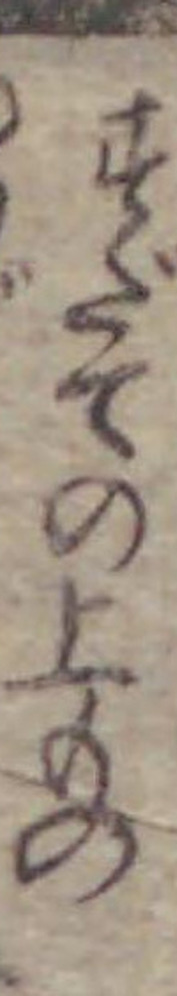すだての上もの
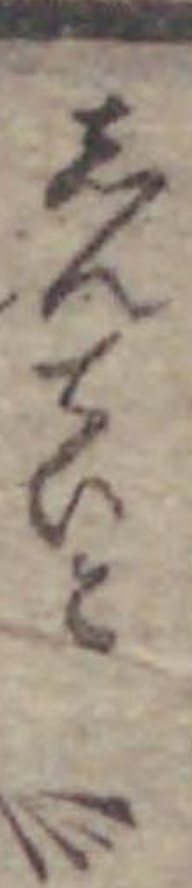しんていと
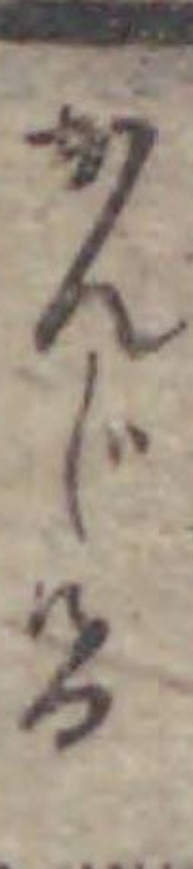かんじける
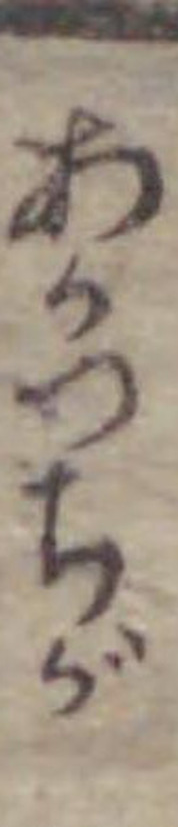あかつちが
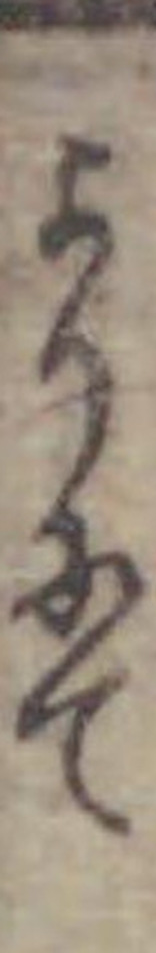よりにて
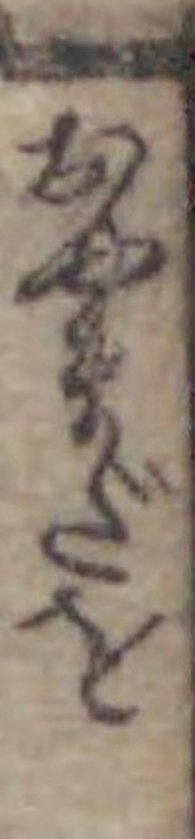おやまだを
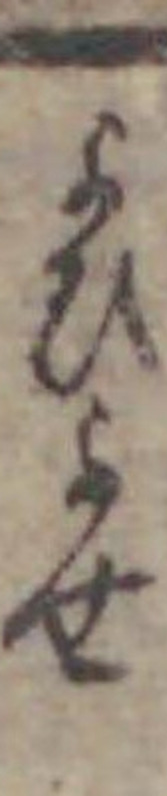よひよせ
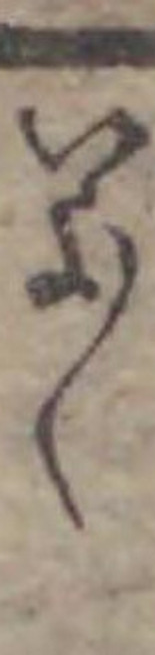いよ〳〵
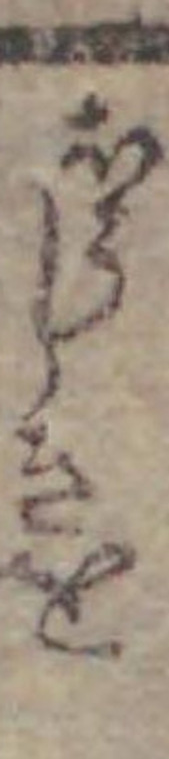ほうしきを
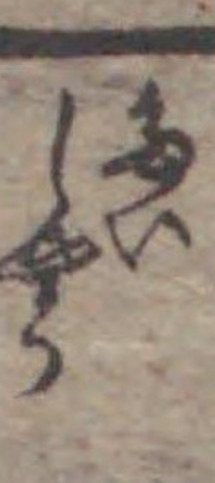しやう
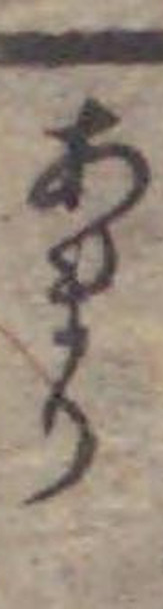あまり
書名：談芭菰誉詞 : 3巻
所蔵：国立国会図書館 National Diet Library, JAPAN
